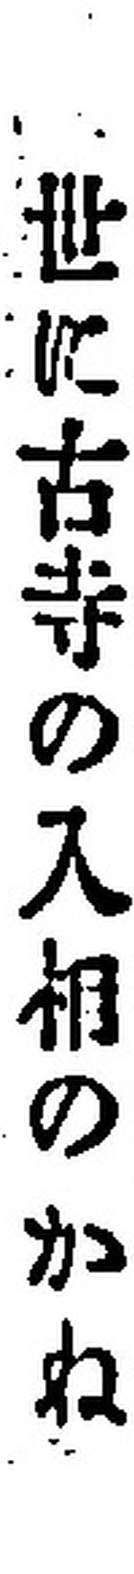世に古寺の入相のかね
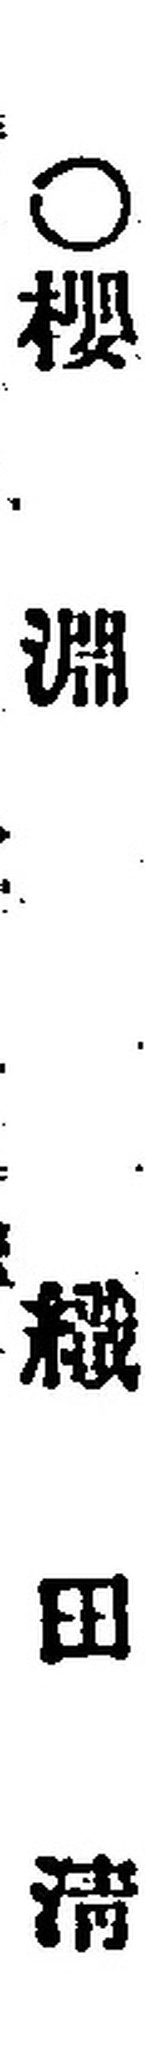○桜淵織田清
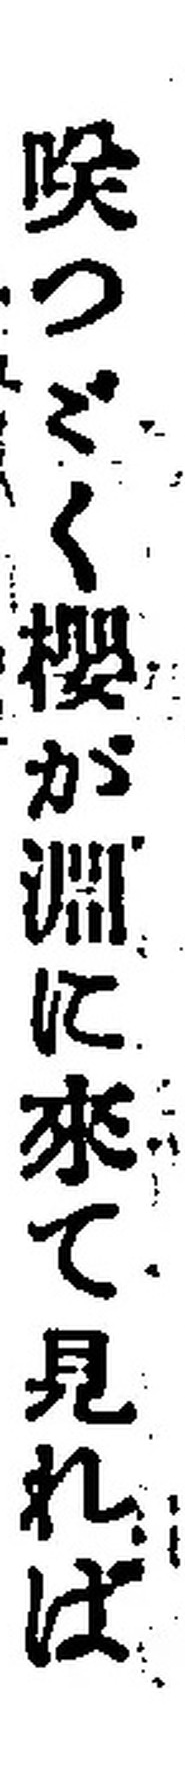咲つゞく桜が淵に来て見れば
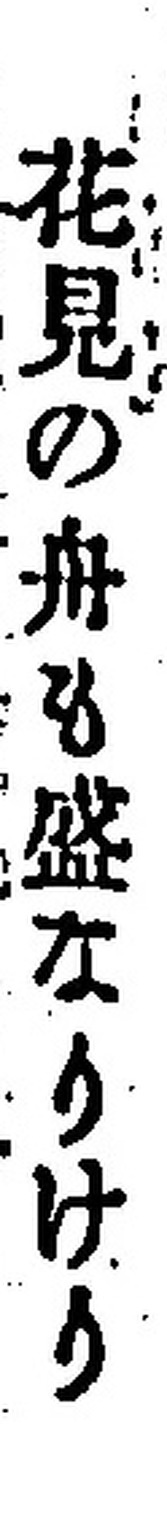花見の舟も盛なりけり
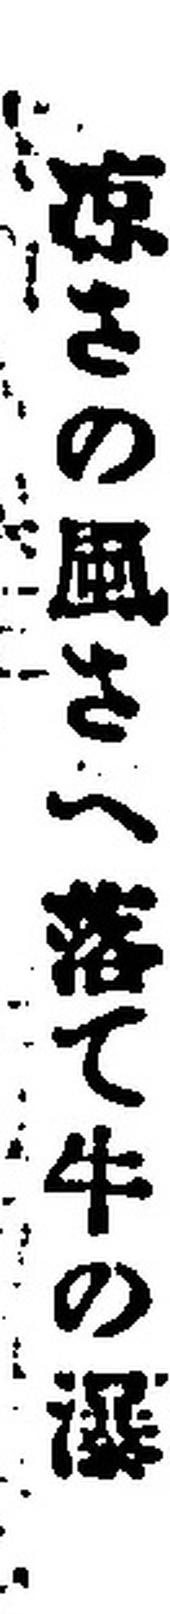涼さの風さへ落て牛の瀑
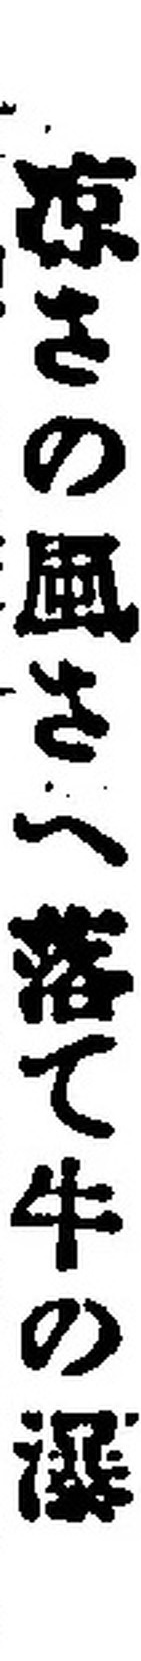涼さの風さへ落て牛の瀑
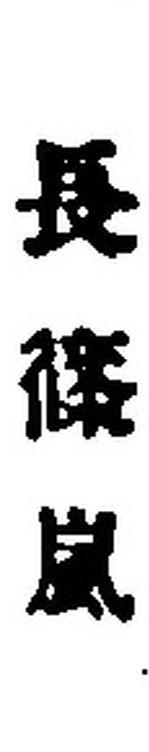長篠嵐
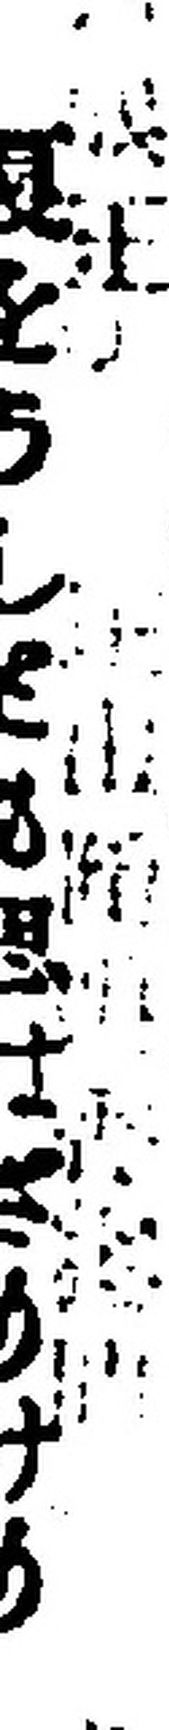夏をうしとも思はざりけり
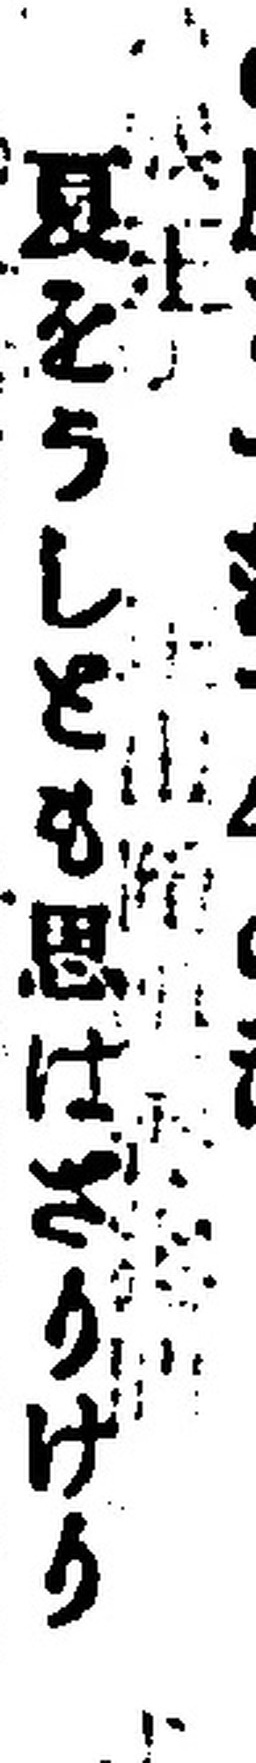夏をうしとも思はざりけり
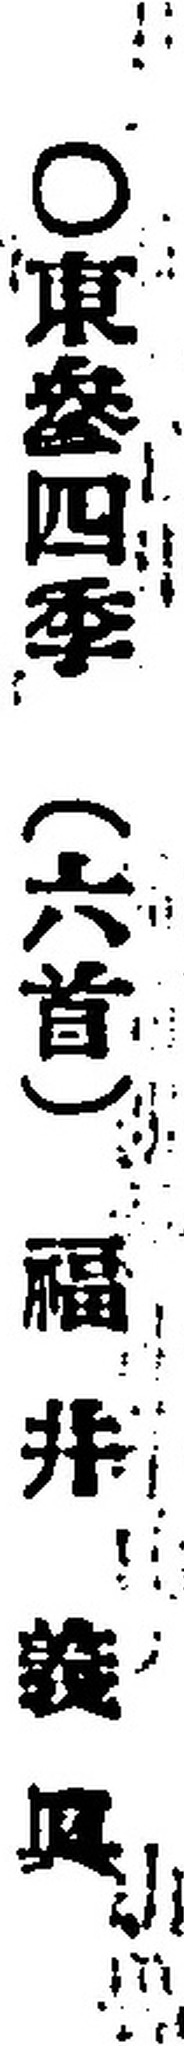○東参四季(六首)福井義真
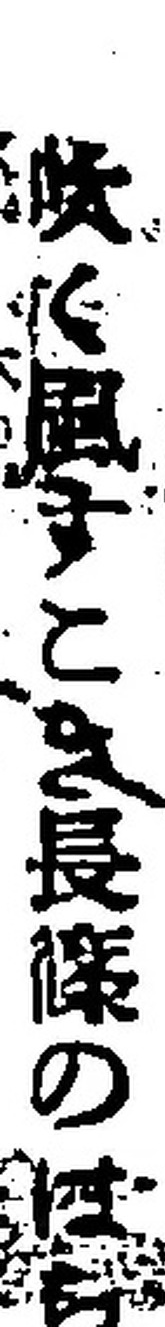吹く風すこき長篠のはち
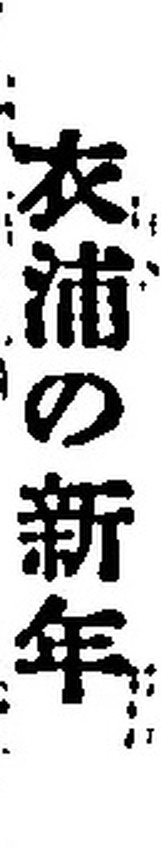衣浦の新年
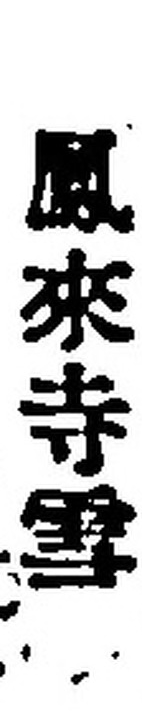鳳来寺雪
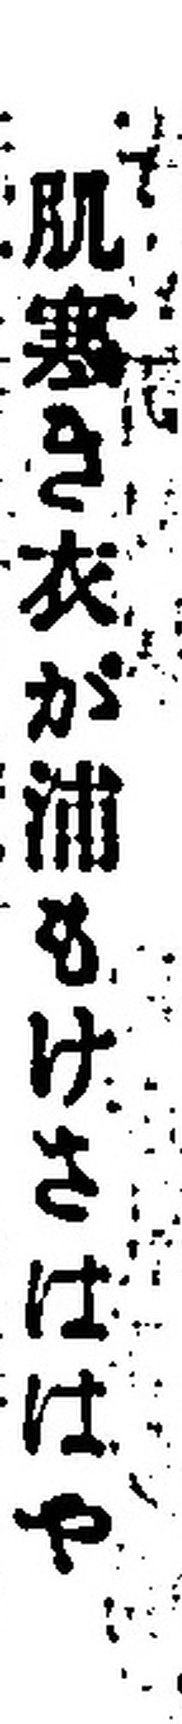肌寒き衣が浦のけさははや
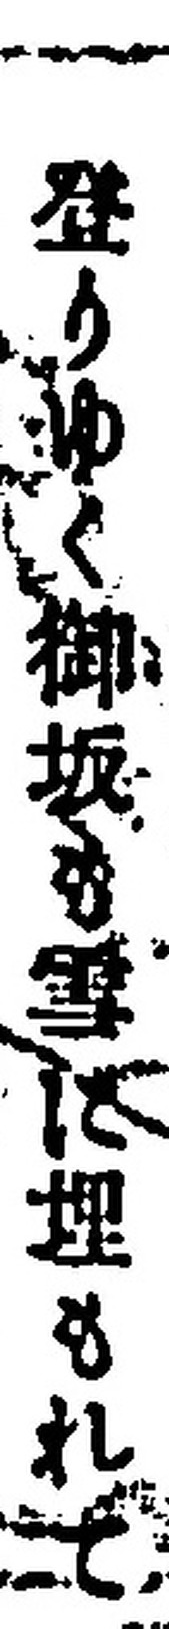登りゆく御坂も雪に埋もれて
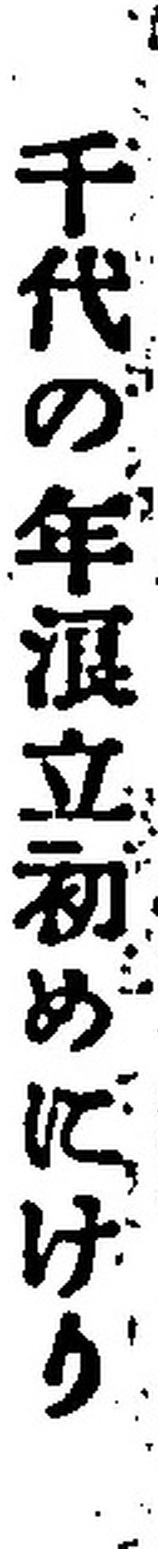千代の年浪立初めにけり
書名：東参名勝案内
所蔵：国立国会図書館 National Diet Library, JAPAN
